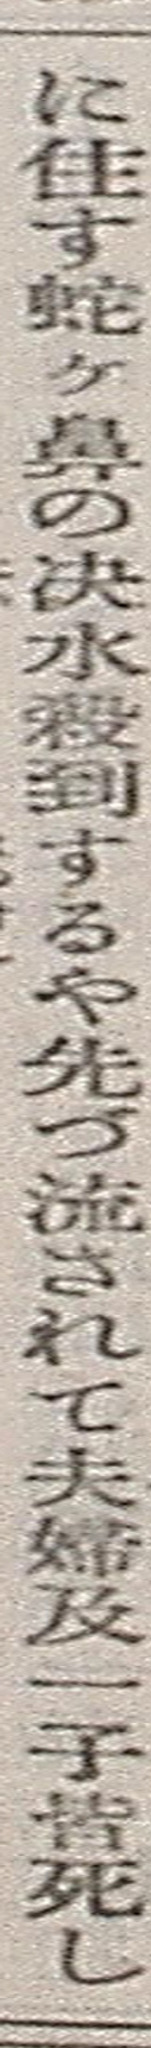に住す蛇ヶ鼻の决水殺到するや先づ流されて夫婦及一子皆死し
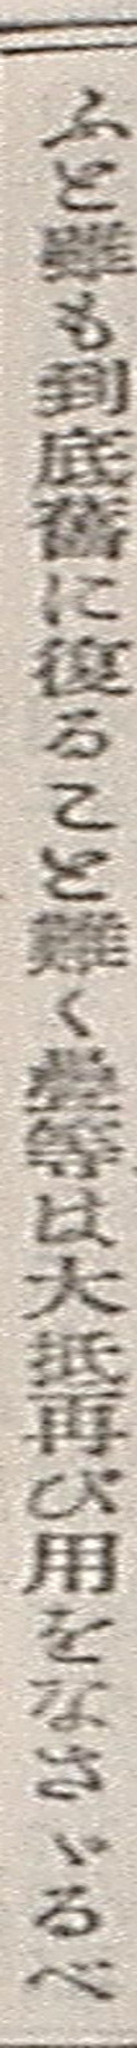ふと雖も到底旧に復ること難く畳等は大抵再び用をなさゞるべ
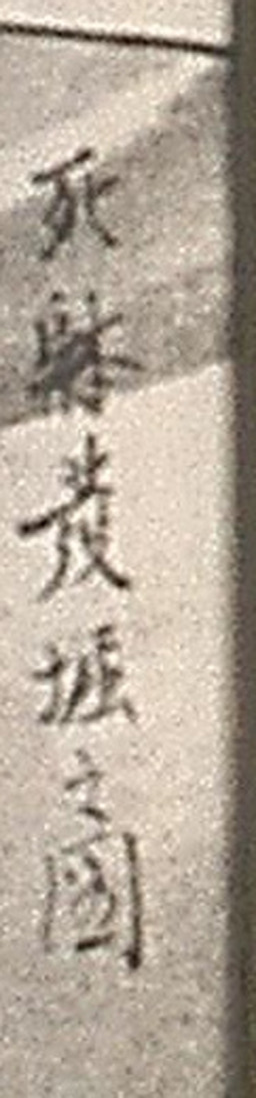死体発掘之圖

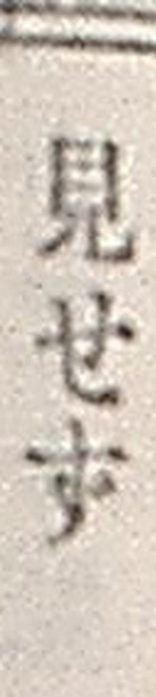見せず
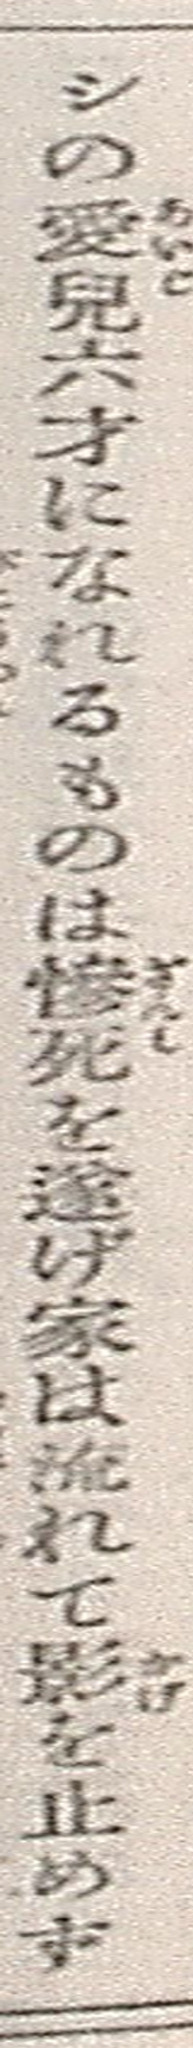シの愛児六才になれるものは惨死を遂げ家は流れて影を止めず
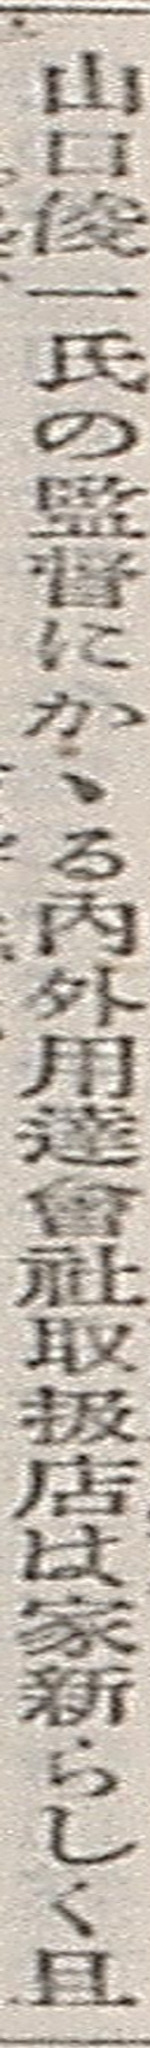山口俊一氏の監督にかゝる内外用達會社取扱店は新らしく且
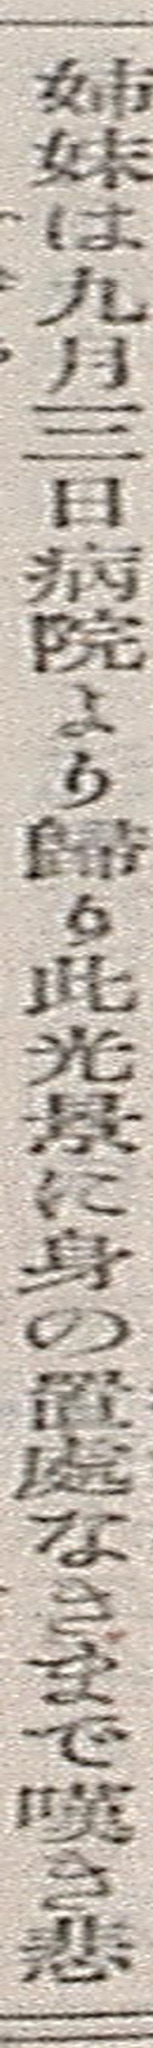姉妹は九月三日病院より帰り此光景に身の置処なきまで歎き悲
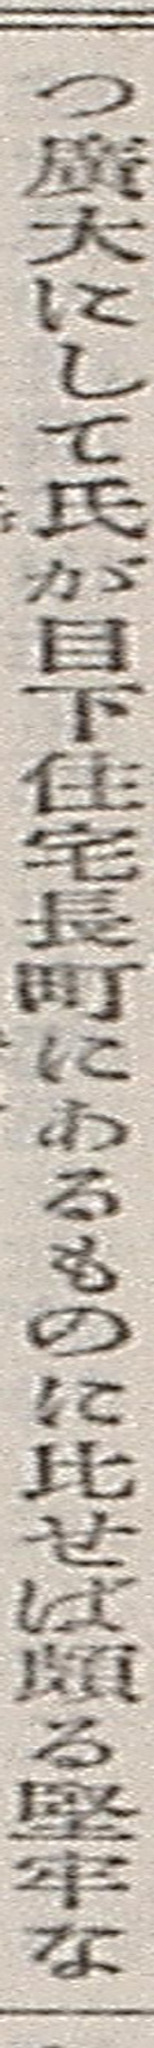つ廣大にして氏が目下住宅長町にあるものに比せば頗る堅牢な
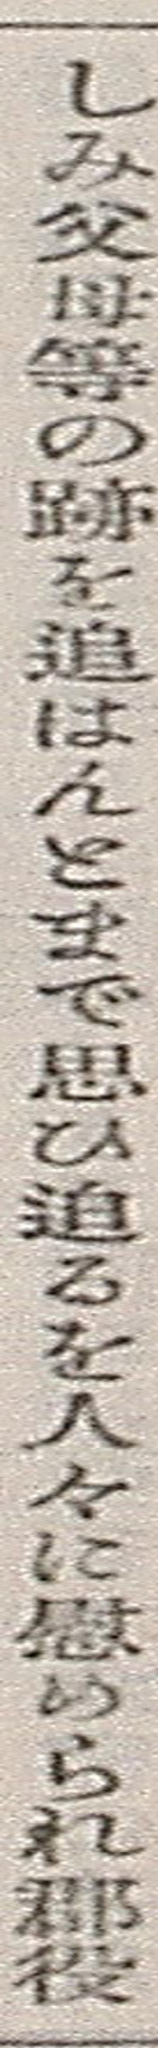しみ父母等の跡を追はんとまで思ひ迫るを人々に慰められ郡役
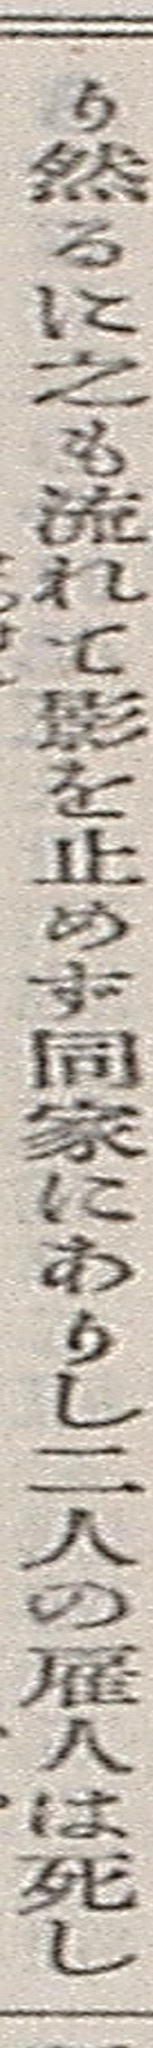り然るに之も流れて影を止めず同家にありし二人の雇人は死し
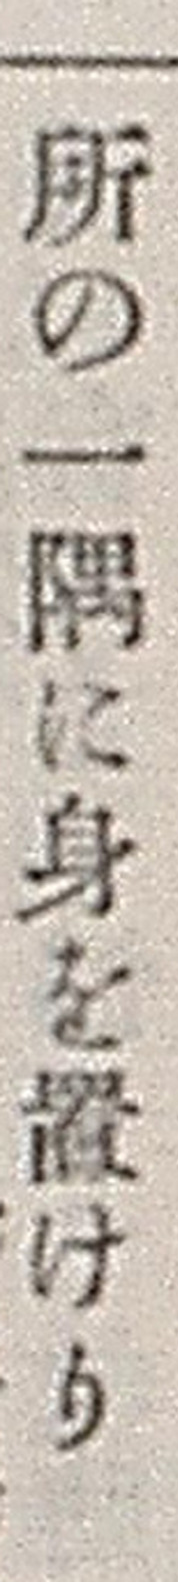所の一隅に身を置けり
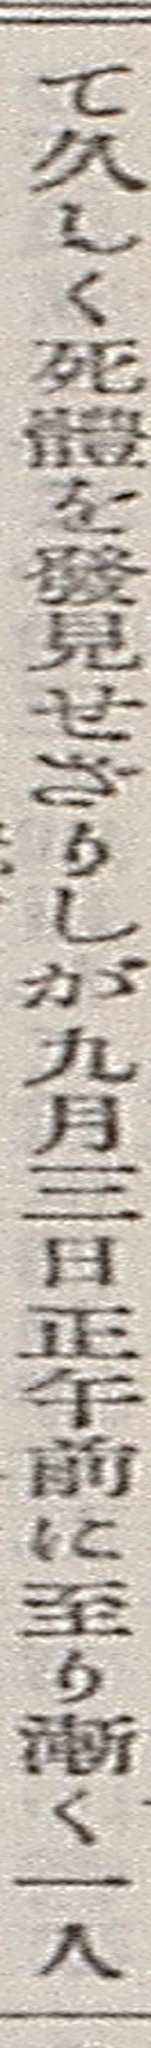て久しく死体うを発見せざりしが九月三日正午前に至り漸く一人
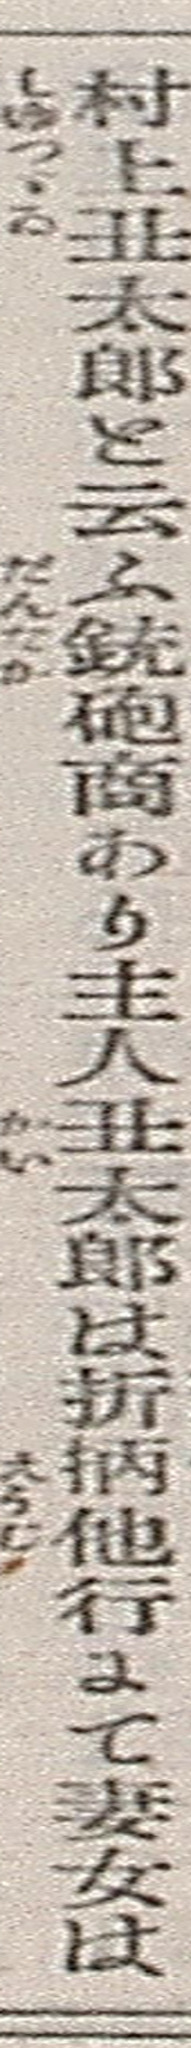村上丑太郎と云ふ銃砲商あり主人丑太郎は折柄他行にて妻子は
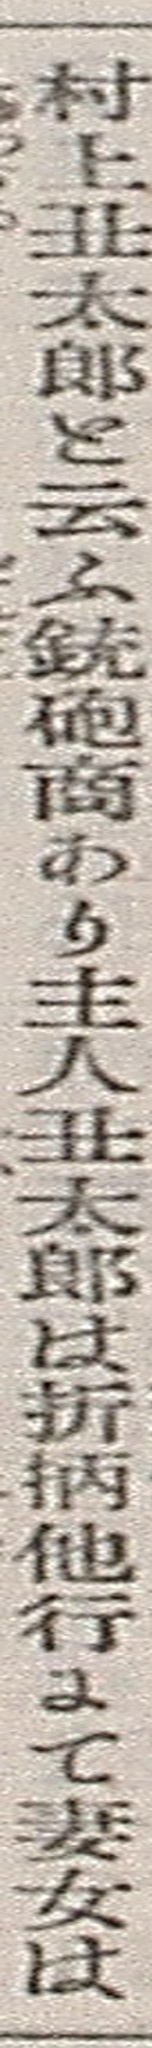村上丑太郎と云ふ銃砲商あり主人丑太郎は折柄他行にて妻子は
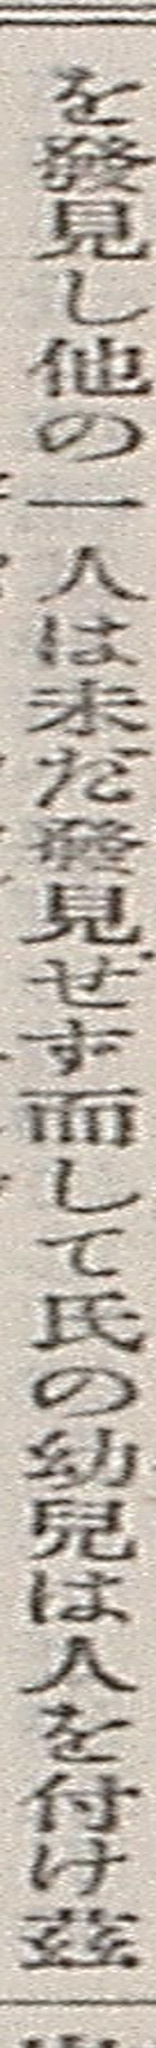を発見し他の一人は未だ発見せず而して氏の幼児は人を付け茲
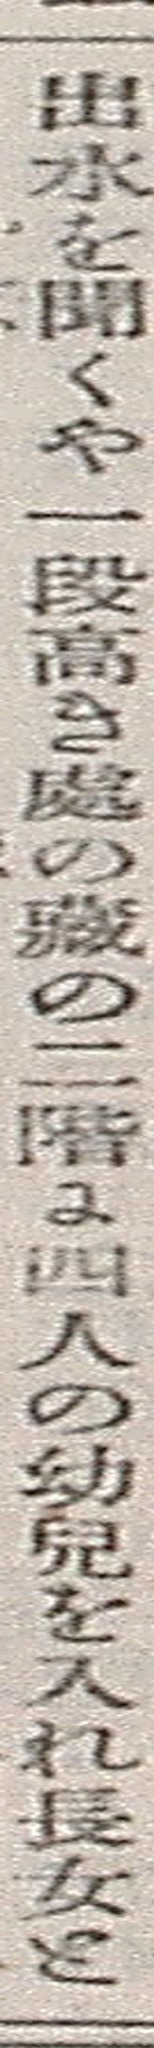出水を聞くや一段高き処の蔵の二階に四人の幼児を入れ長女と
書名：風俗畫報臨時増刊第百二十六號　洪水被害録（中）
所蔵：東京大学地震研究所図書室 Earthquake Research Institute Library, The University of Tokyo, JAPAN
